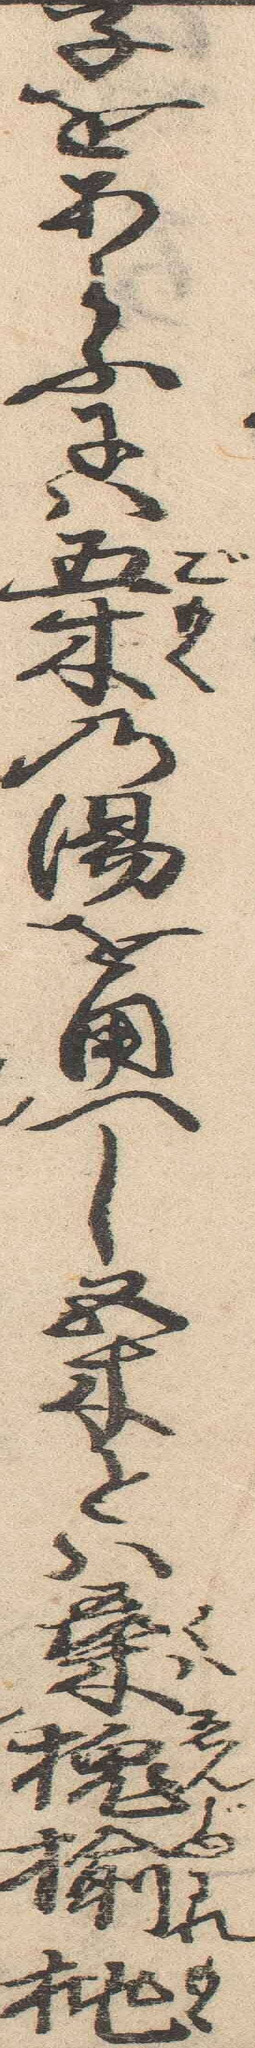子をあらふには五木の湯を用へし五木とは桑槐楡桃
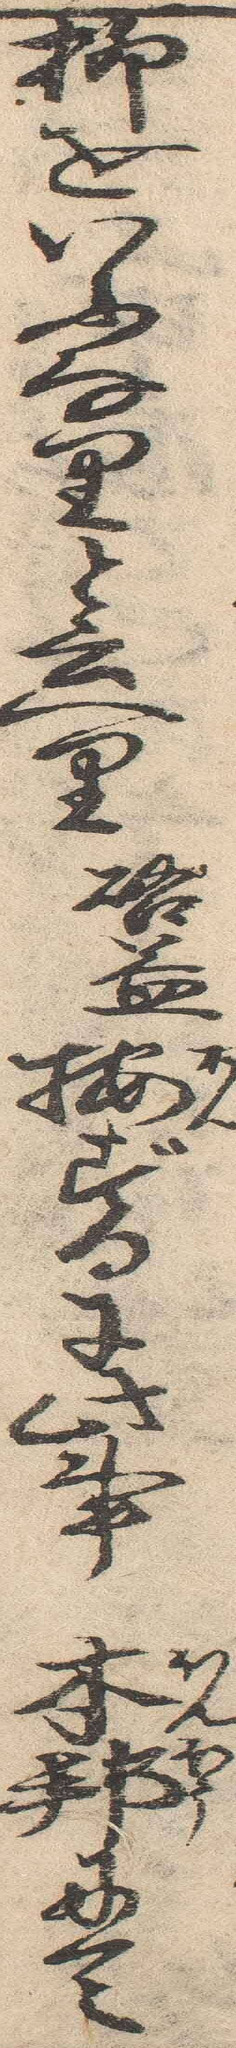柳をいふなりと云へり啓益按ずるに此事本邦にて
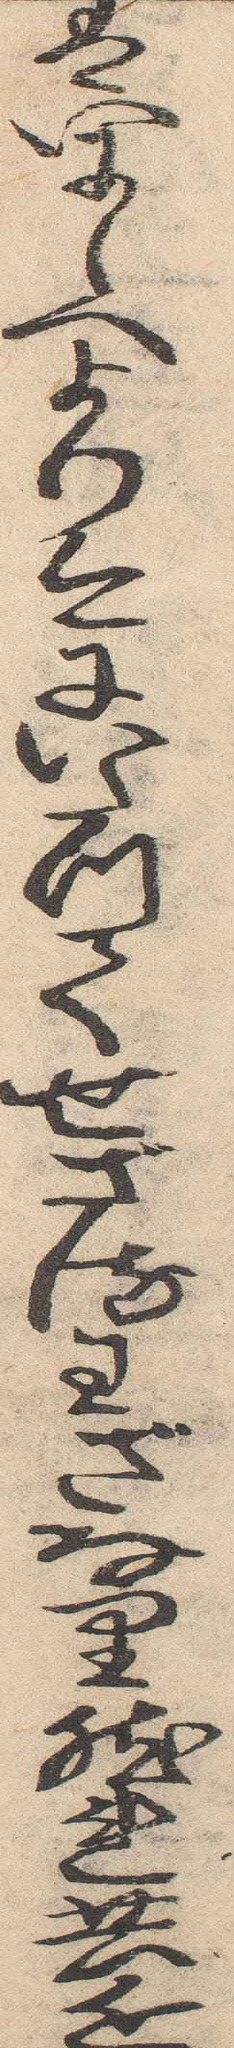はいにしへより今にいたつてせざるわざなり然れ共を
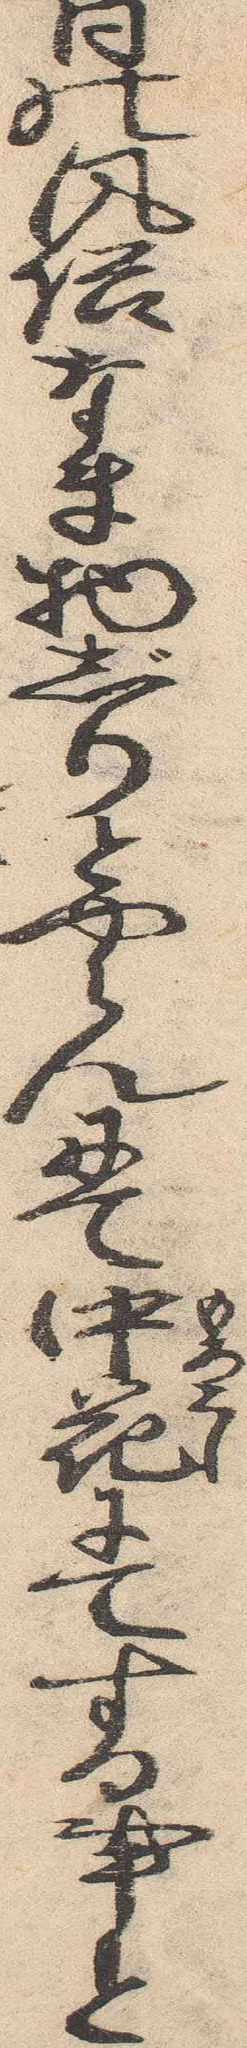日の風俗なま物じりとやらんにて中花にてする事と
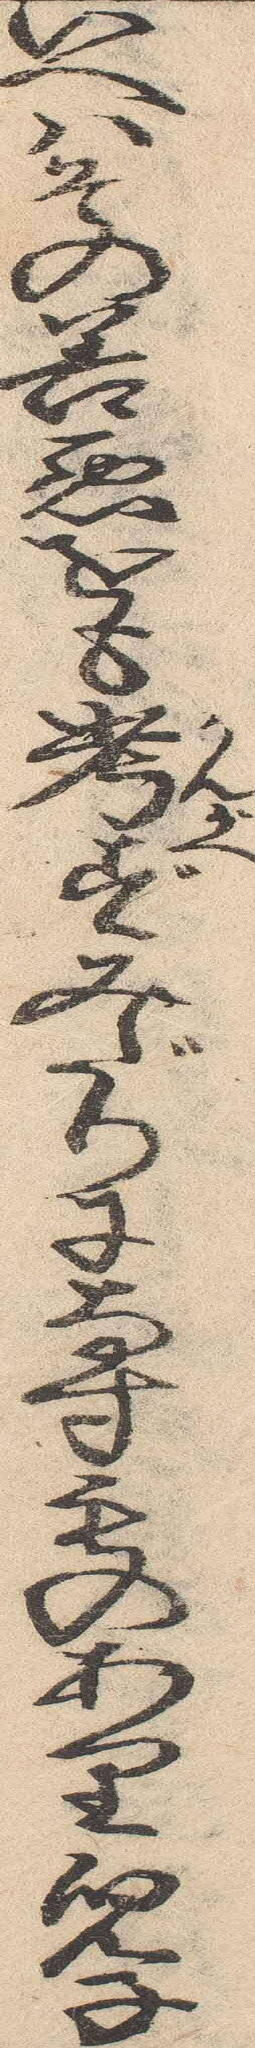いへはその善悪をも考ずみだりになすものあり児子
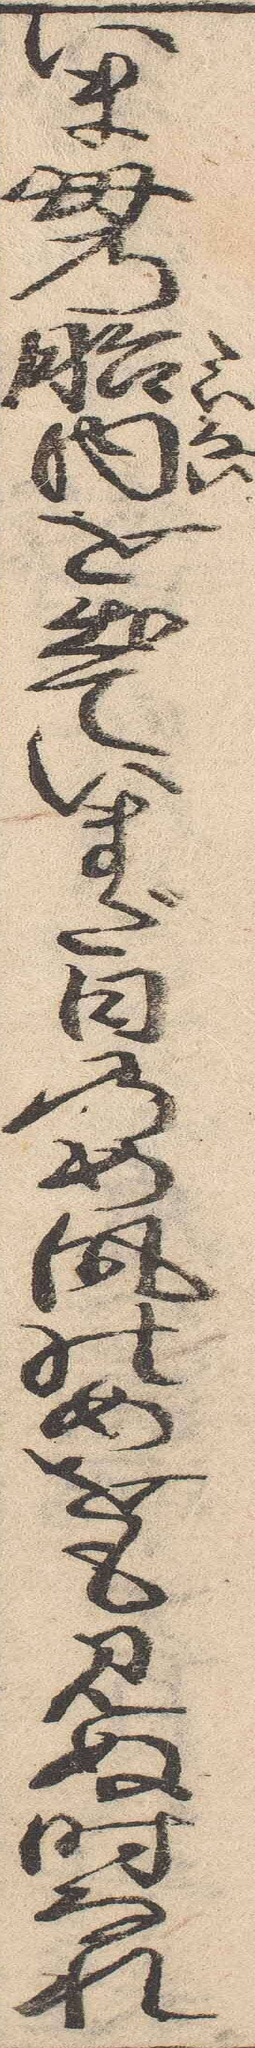いま母の胎内を出ていまだ日のめ風のめをも見ぬ時なれ
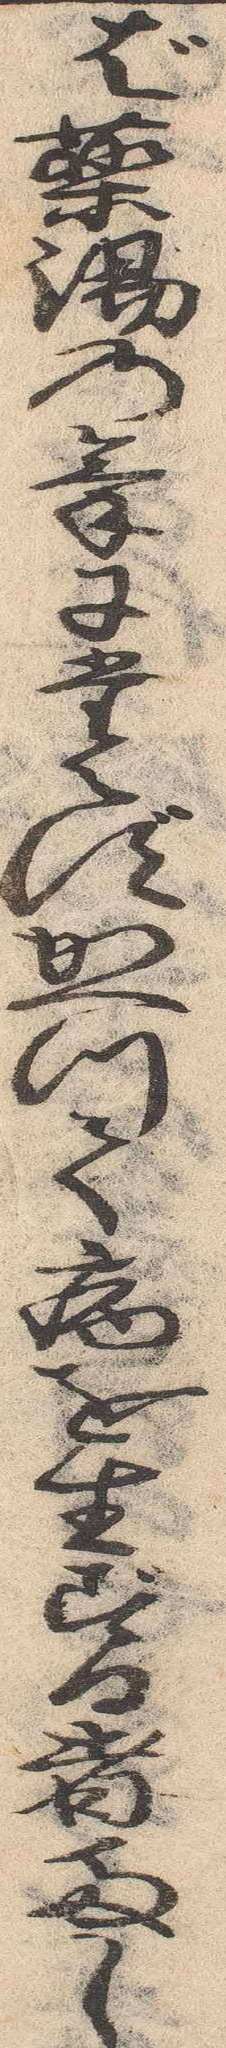ば薬湯の氣にたゝずかへつて病を生ずる者多し
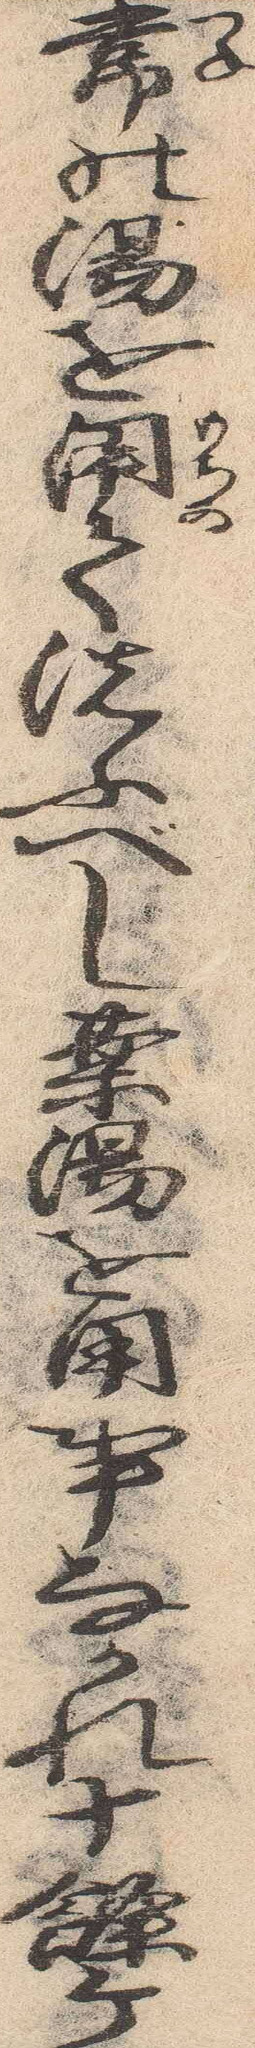常の湯を用て洗ふべし薬湯を用事なかれ十餘ケ
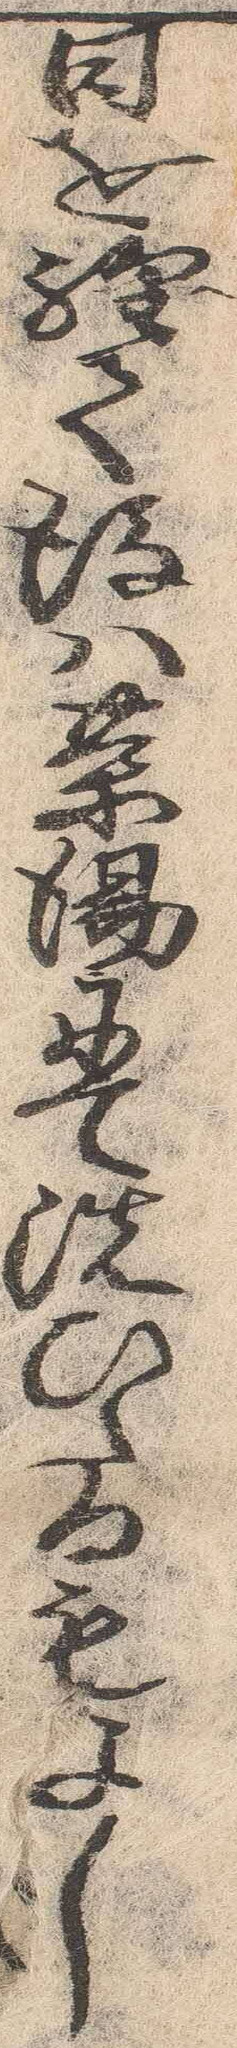日を経て後は薬湯にて洗ひたるもよし
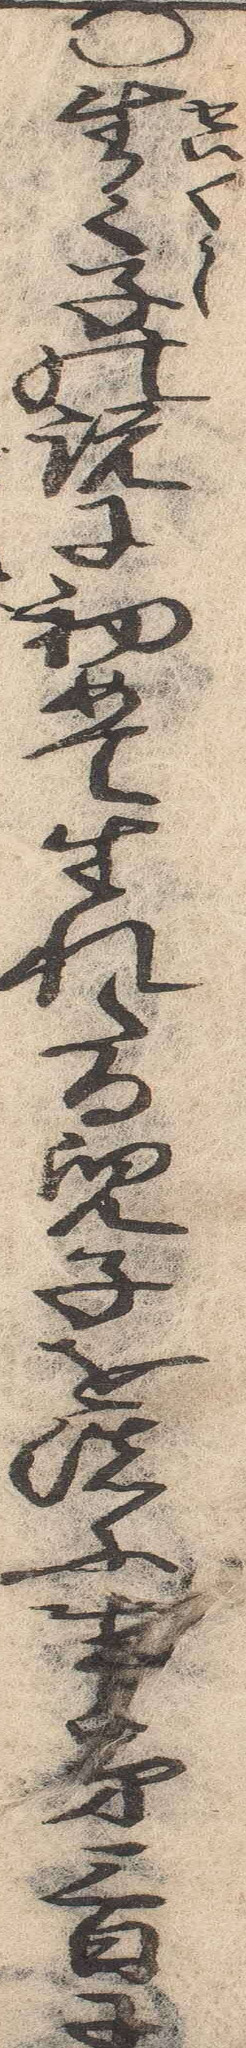◯生々子の説に初めて生れたる児子を洗ふ第三日に
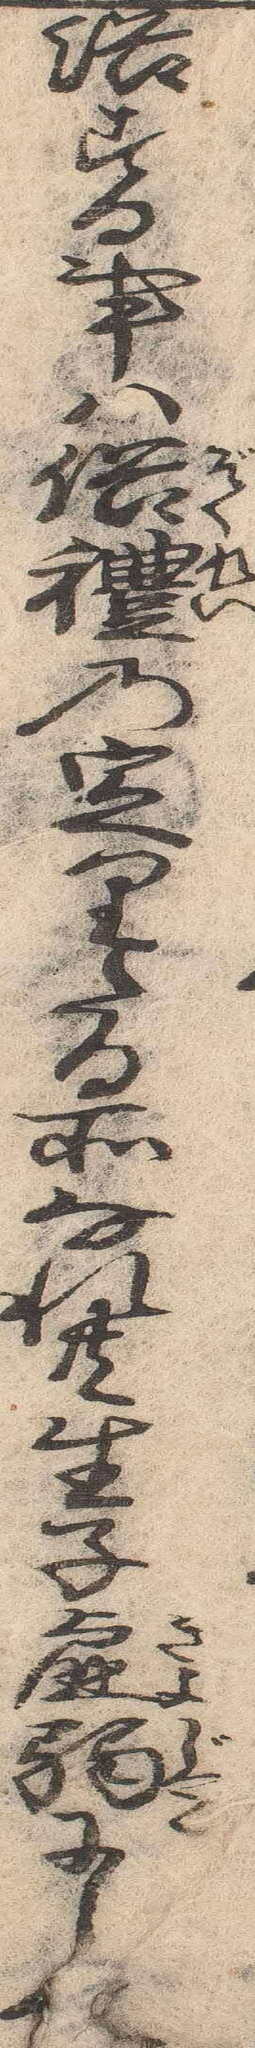浴する事は俗禮の定りたる所なれ共生子虚弱にして
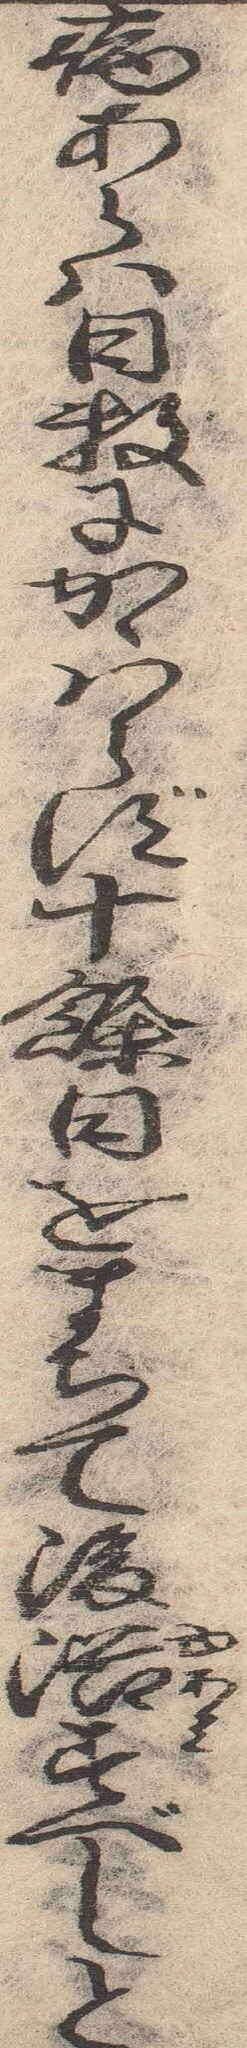病あらは日数にかゝはらず十餘日をまちて後浴すべしと
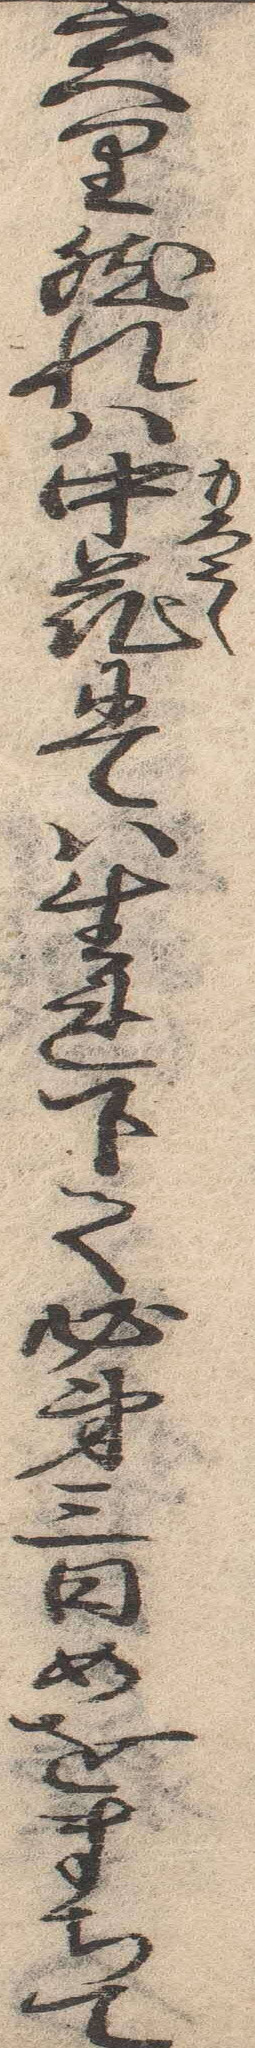云へり然れは中花にては生れ下て必第三日めをまちて
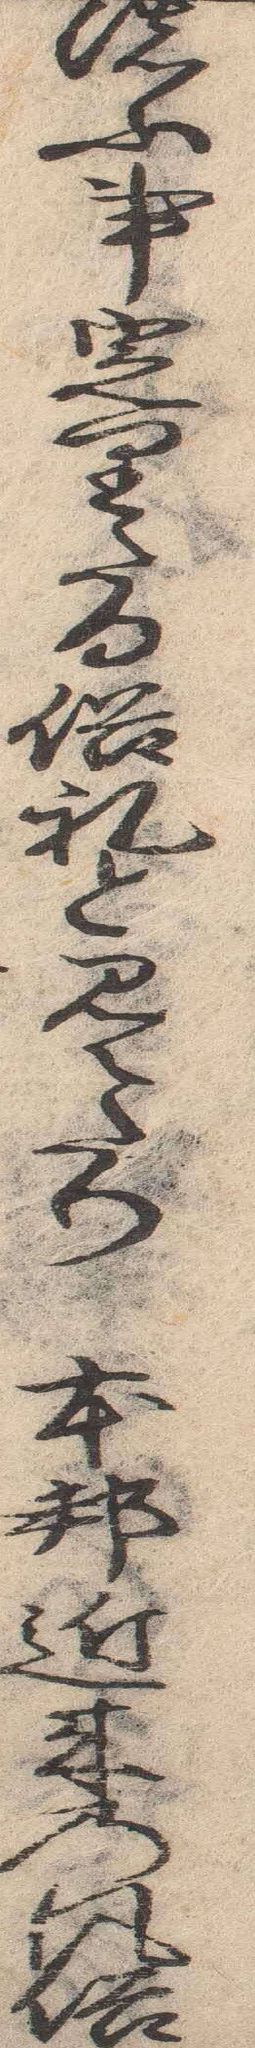洗ふ事定りたる俗礼と見えたり本邦近来の風俗
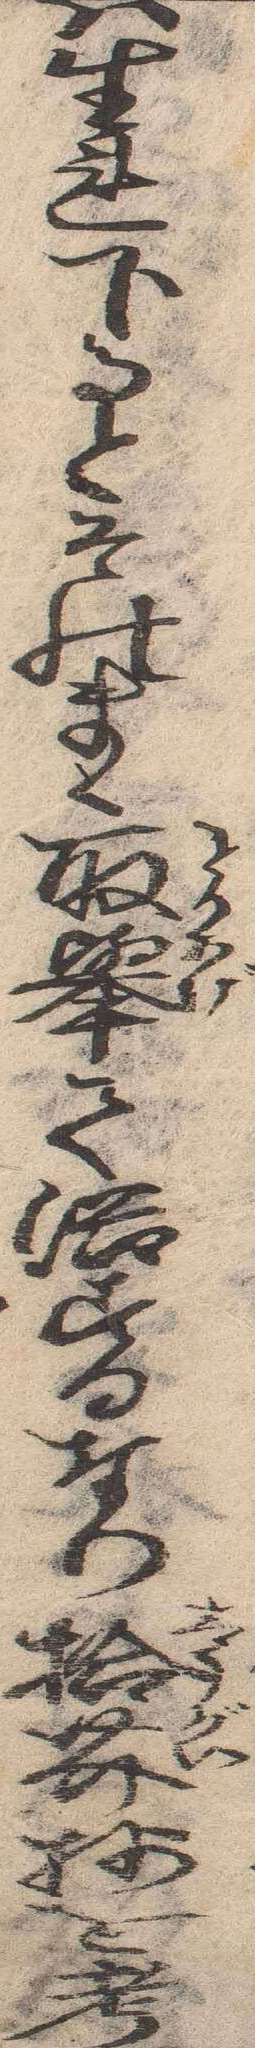は生れ下るとそのまゝ取擧て浴するなり拾芥抄を考
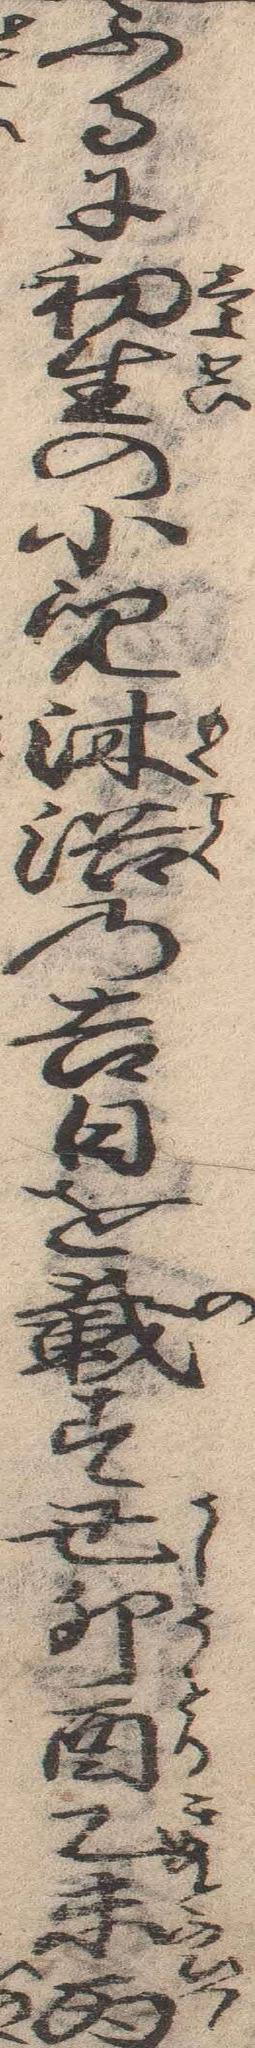ふるに初生の小児沐浴の吉日を載す丑卯酉乙未丙
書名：小児必用養育草
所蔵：東京学芸大学附属図書館 国文学研究資料館
